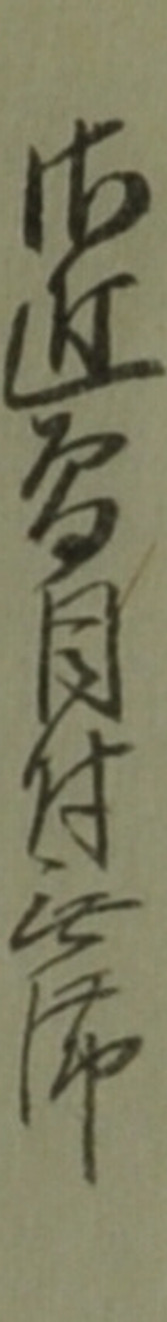御近習目付無滞
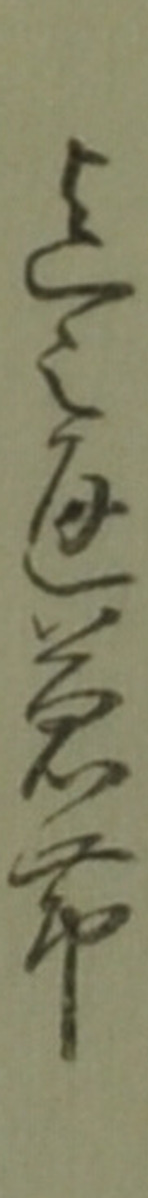迄之通兼帯
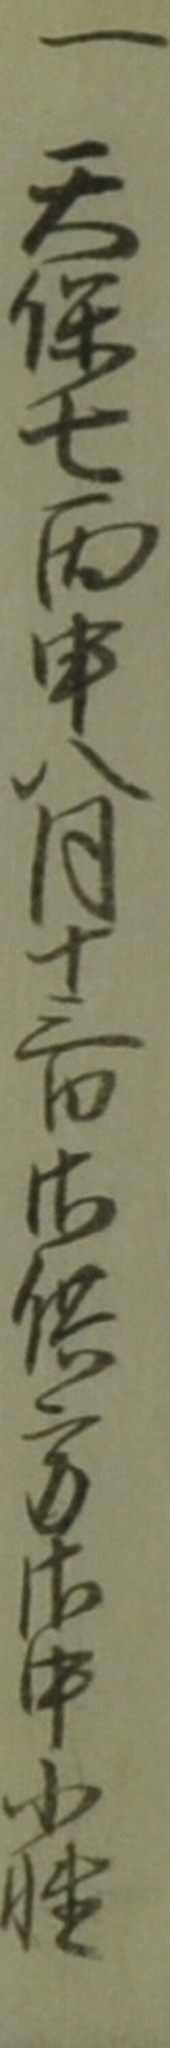一天保七丙申八月十三日御供方御中小性
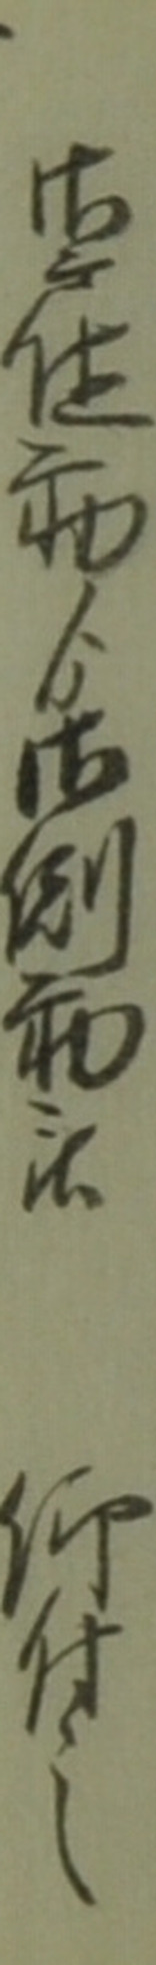御雇勤ゟ御側勤被仰付之
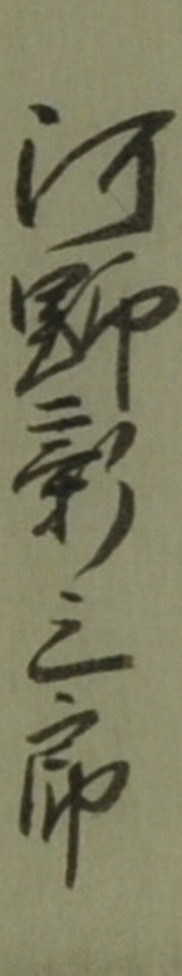河野新三郎
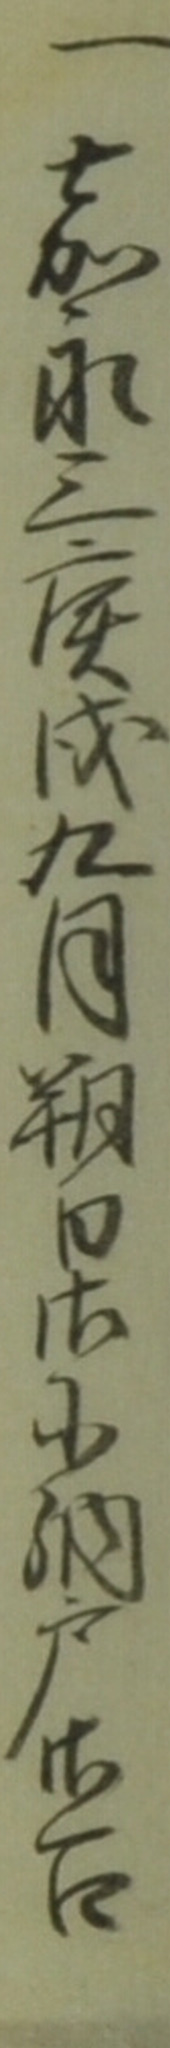一嘉永三庚戌九月朔日御小納戸御召

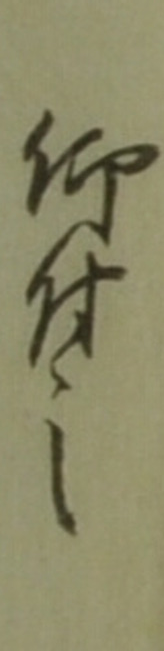仰付之
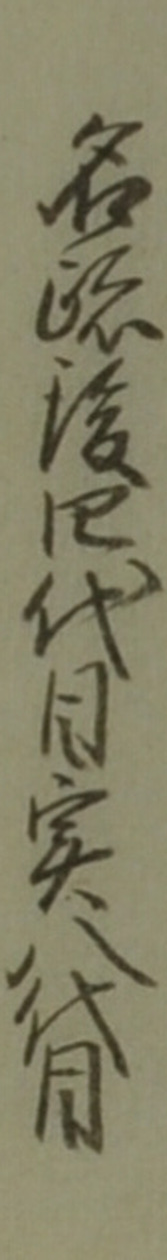名跡後四代目実八代目
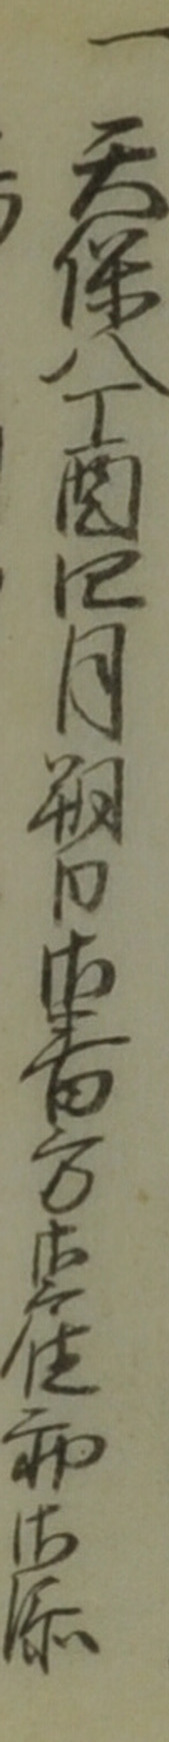一天保八丁酉四月朔日御番方御雇勤御添
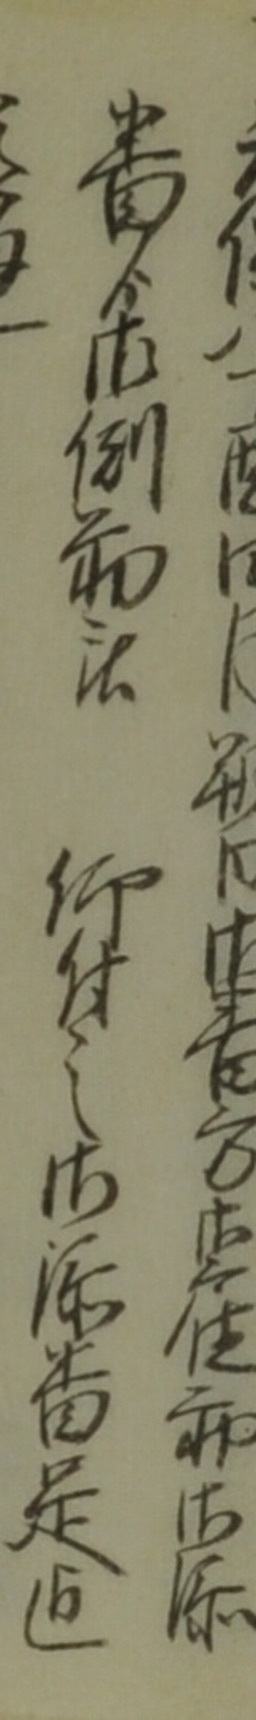番ゟ御側勤被仰付之御添番是迄
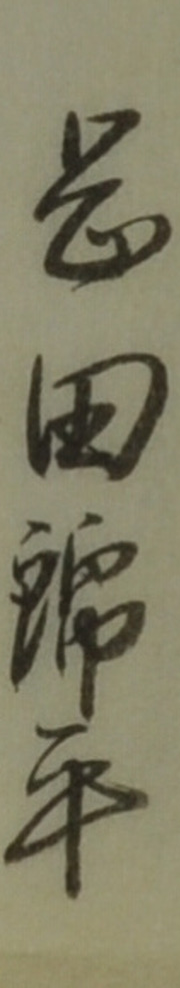岡田錦平
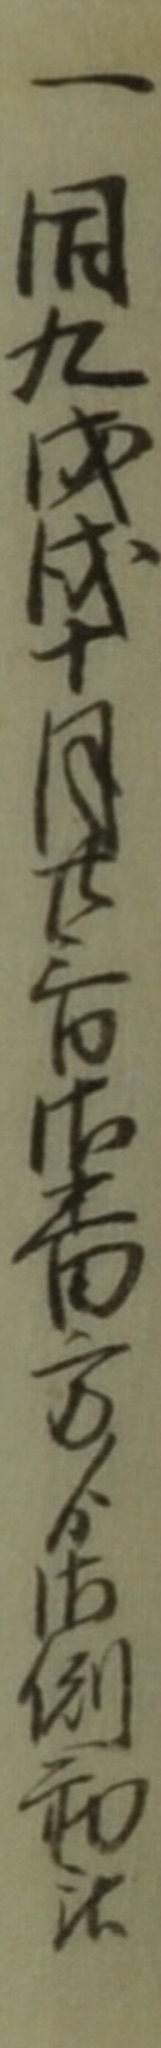一同九戊戌十月廿三日御番方ｙゟ御側勤被
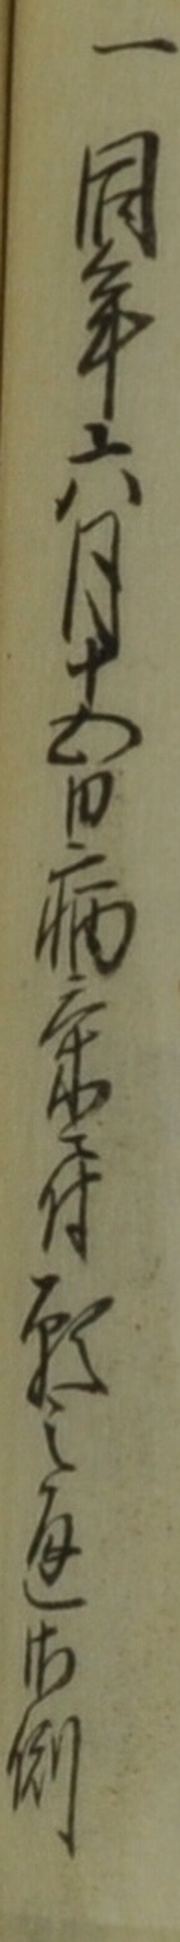一同年六月十五日病気ニ付願之通御側
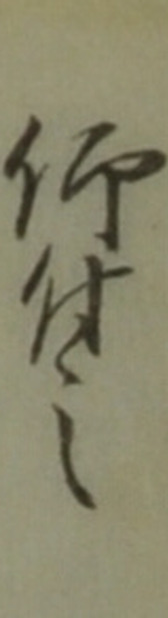仰付之
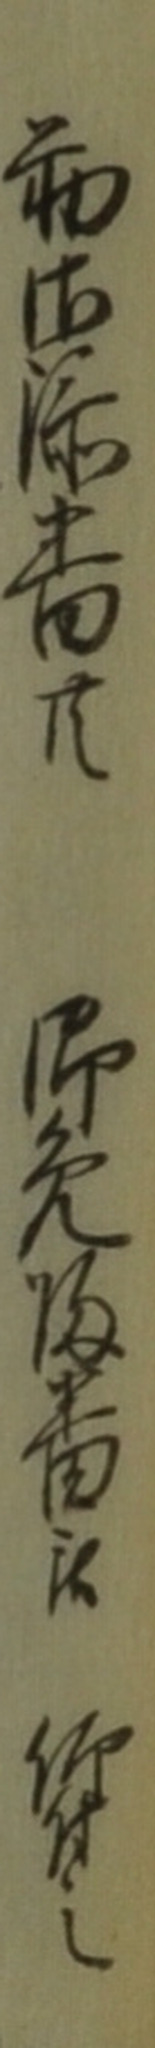勤御添番共御免帰番被仰付之
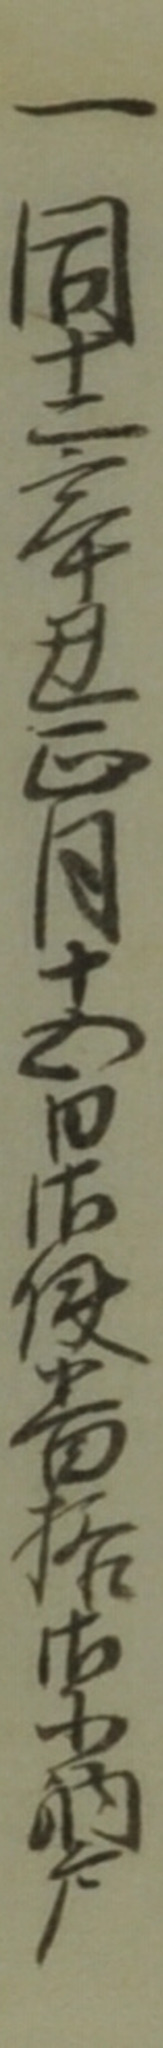一同十二辛丑正月十五日御使番格御小納戸
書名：諸御役代々録（五）
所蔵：伊那市立高遠町図書館・合同会社AMANE
